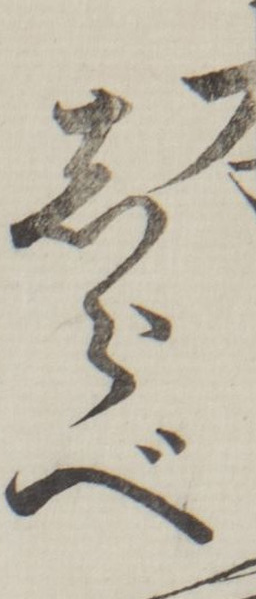しらべ
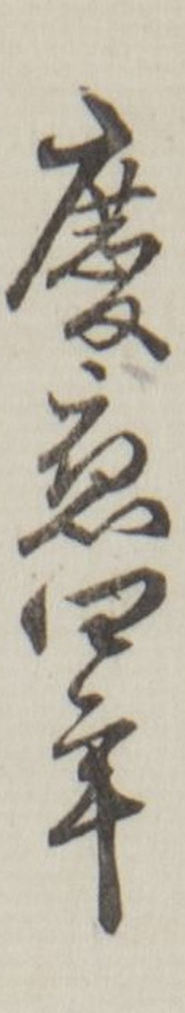慶応四年
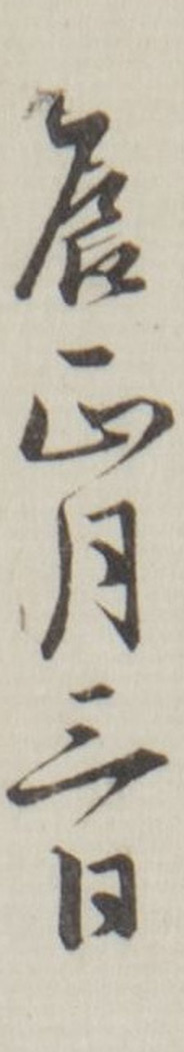辰正月三日
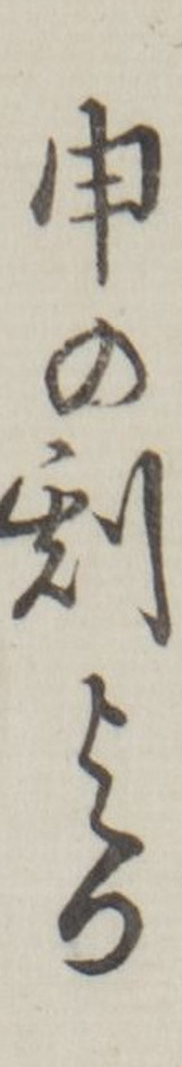申の刻より
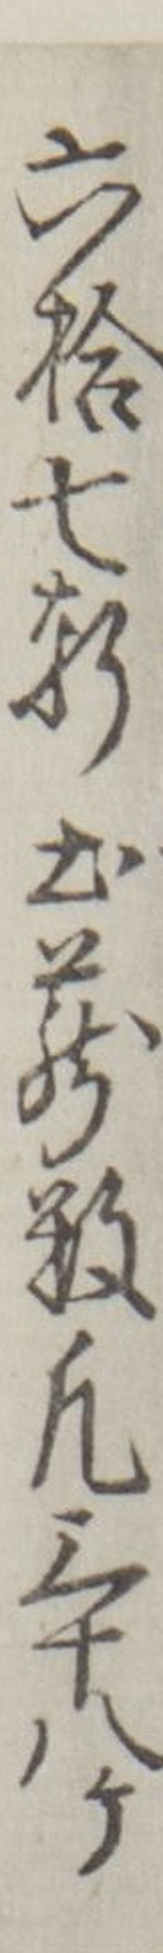六拾七軒土蔵数凡三十八ヶ
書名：本しらべ城州伏見大火の図
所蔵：あいおいニッセイ同和損保株式会社
